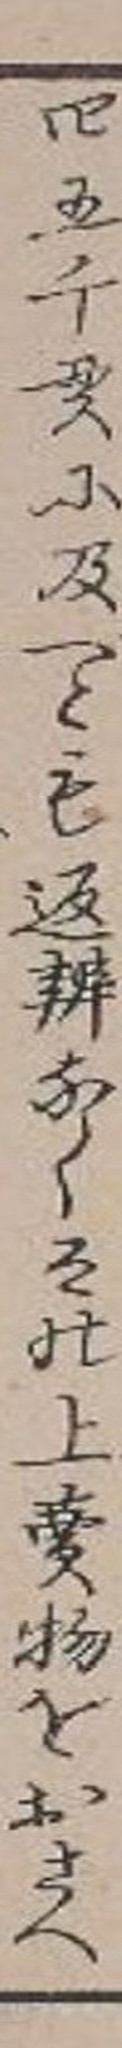四五千貫に及べとも返弁なく、その上売物をおさへ
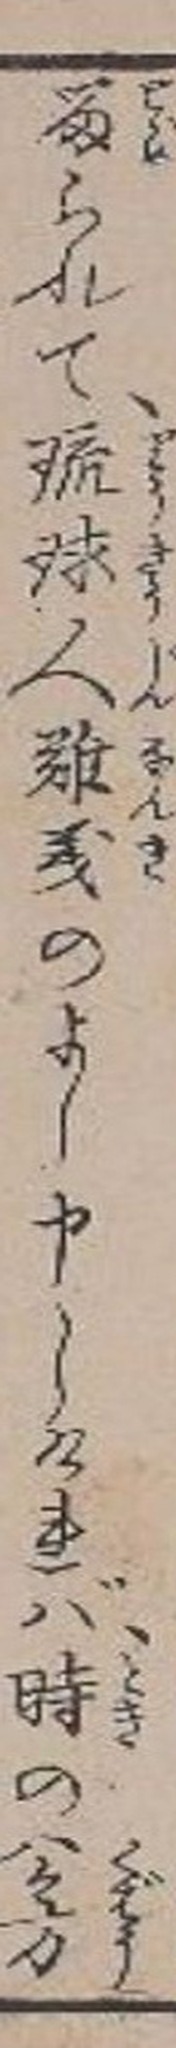留られて、琉球人難義のよし申しければ、時の公方
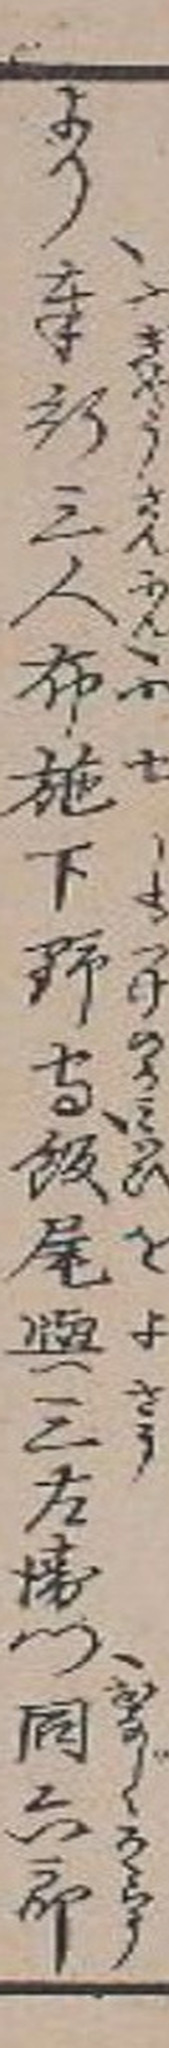より、奉行三人、布施下野守、飯尾与三左衛門、同六郎

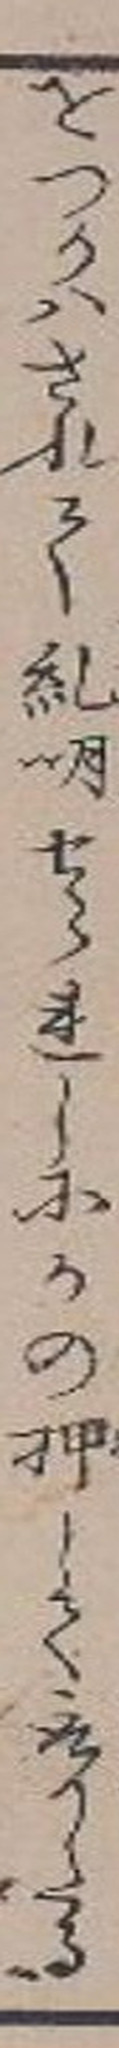をつかはされて、糺明せられしにかの押して取りたる
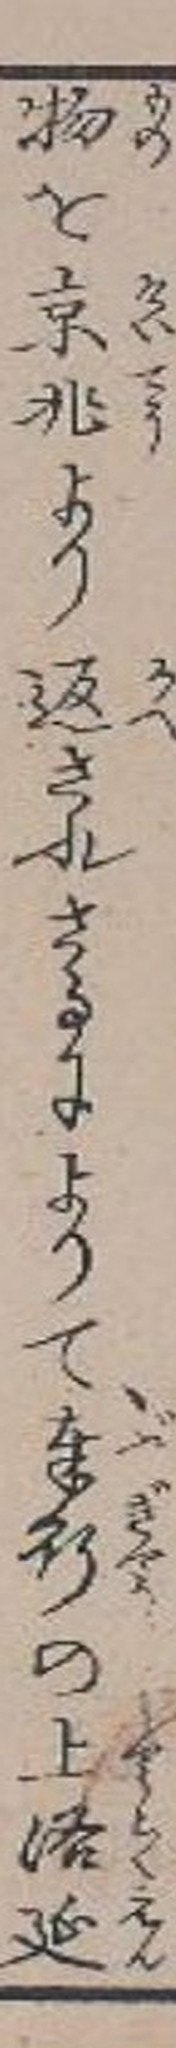物を京兆より返されさるによりて、奉行の上洛延
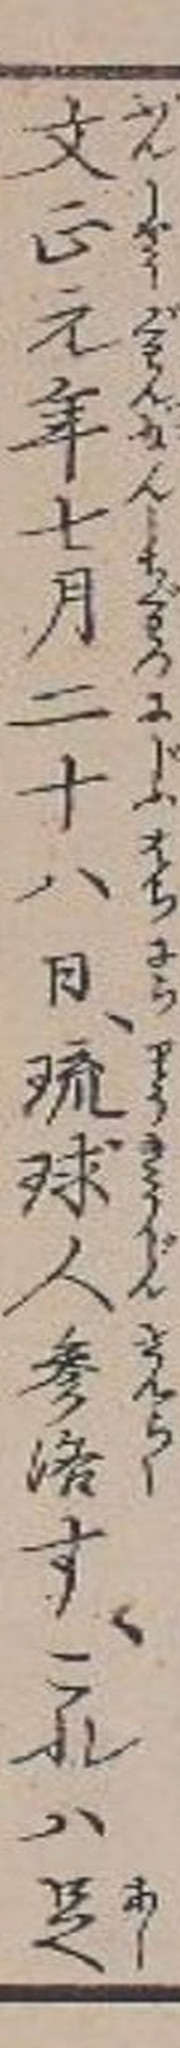文正元年七月二十八日、琉球人参洛す、これは足
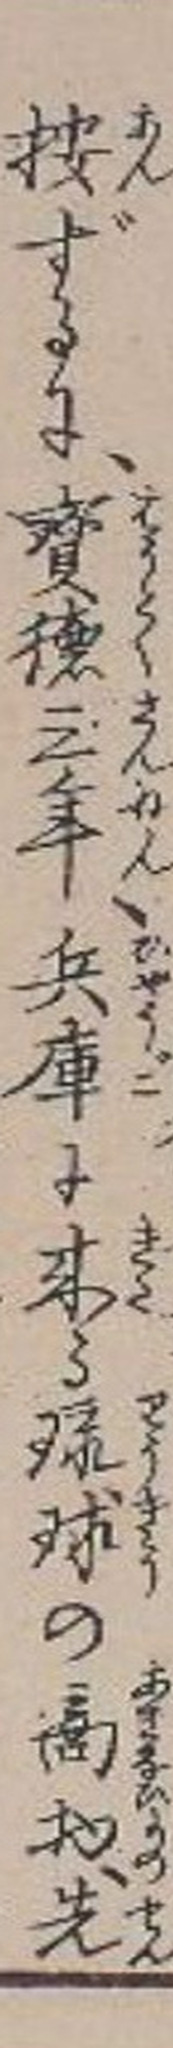按ずるに、宝徳三年、兵庫に来る琉球の商物、先
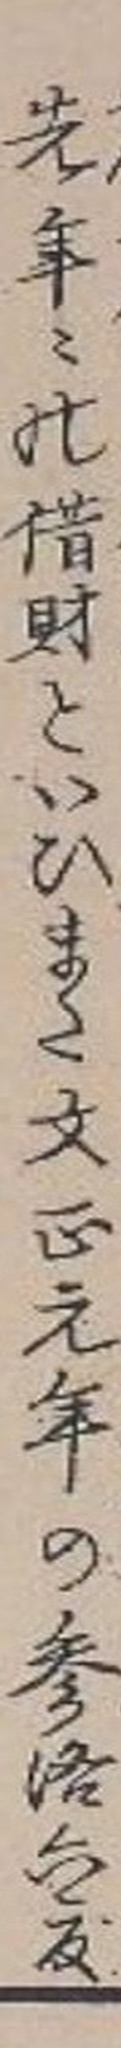先年々の借財といひ、また文正元年の参洛六度
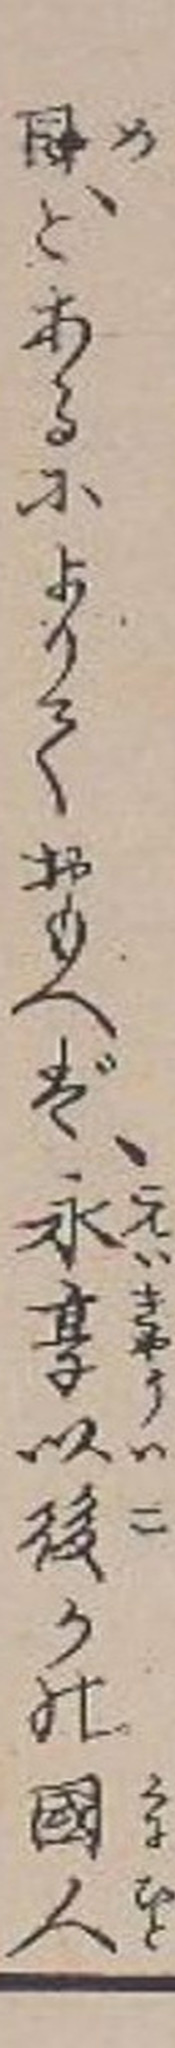目、とあるによりておもへば、永享以後かの国人
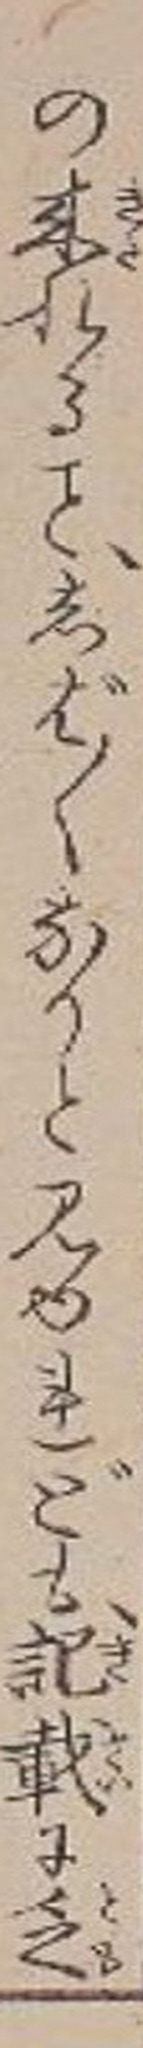の来れること、しば〳〵なりと見ゆれども、記載に乏
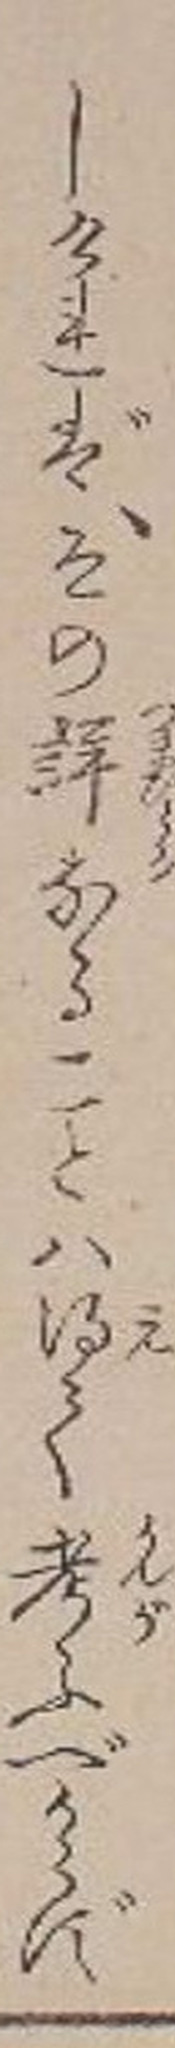しければ、その詳なることは得て考ふべからず
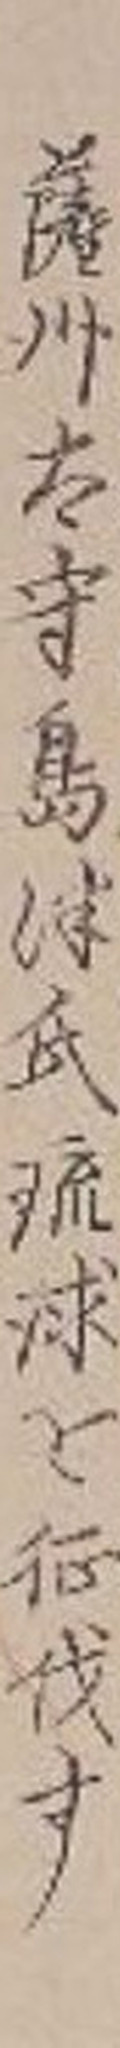薩州太守島津氏琉球を征伐す
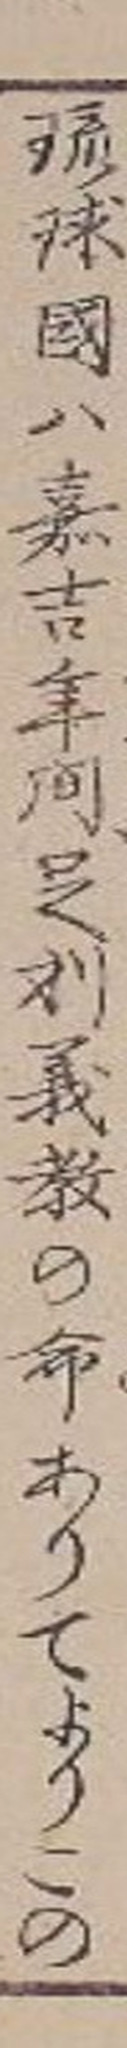琉球国は、嘉吉年間、足利義教の命ありてよりこの
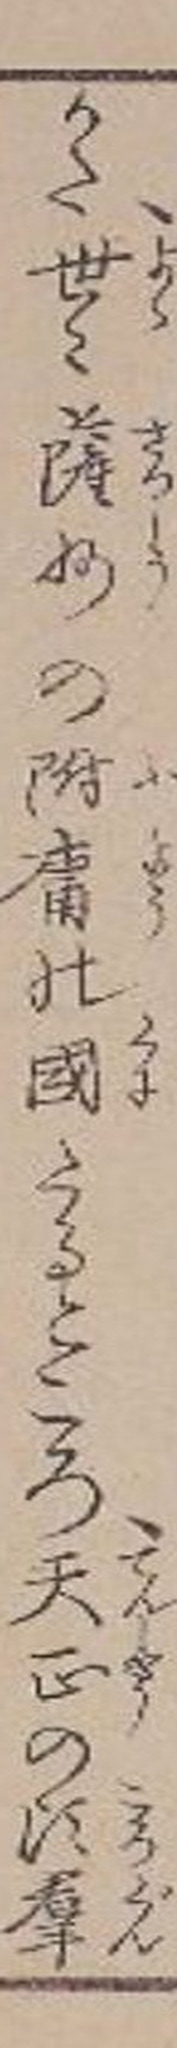かた、世々薩州の附庸の国たるところ、天正の頃群
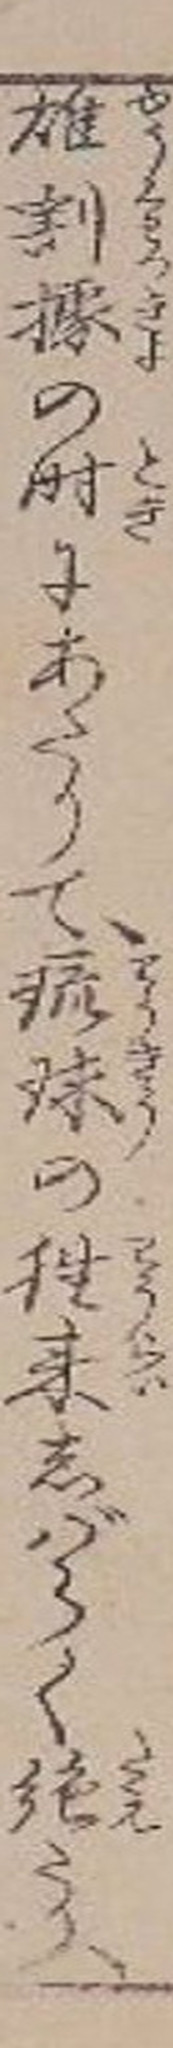雄割拠の時にあたりて、琉球の往来しばらく絶たり、
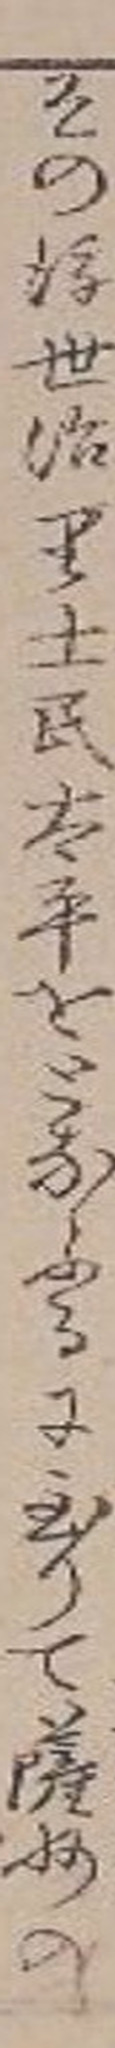その後世治り士民太平をとなふるに至りて、薩州の
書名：琉球入貢紀略
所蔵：University of the Ryukyus Library
